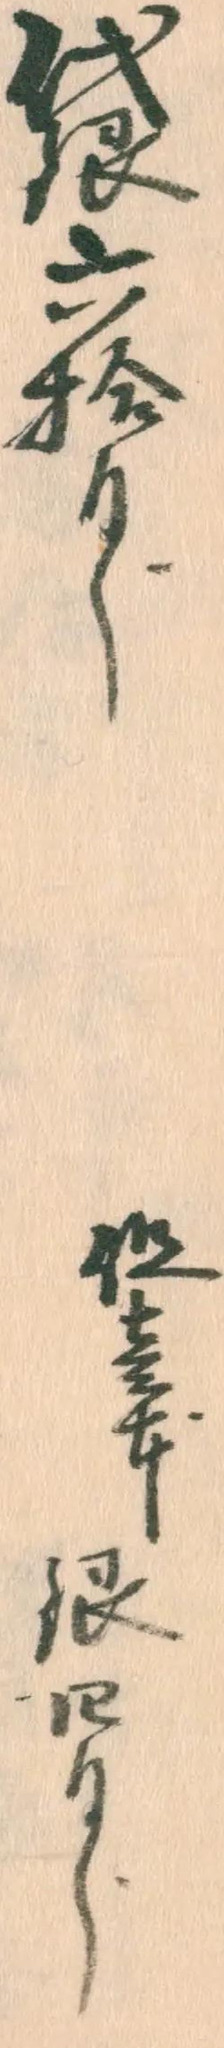代銀六拾匁但壱本銀四匁
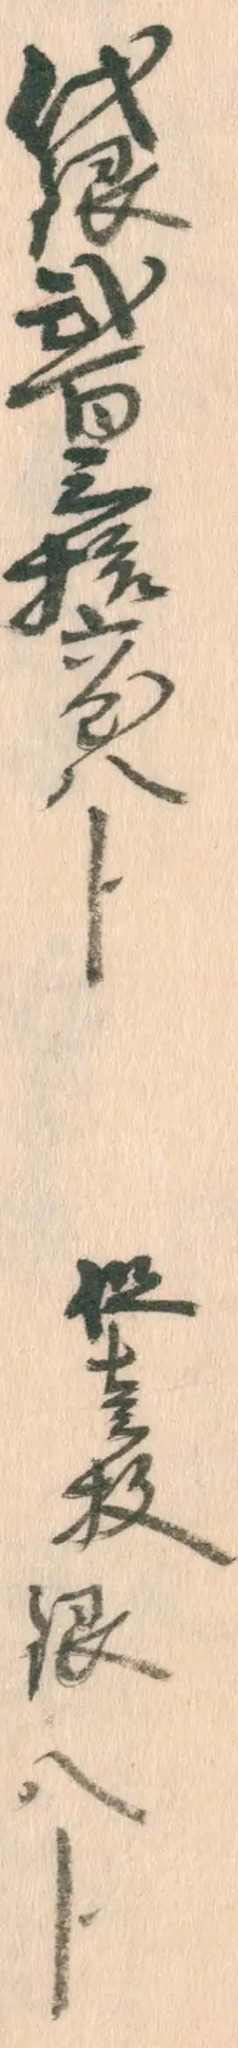代銀弐百三拾六匁八分但壱枚銀八分
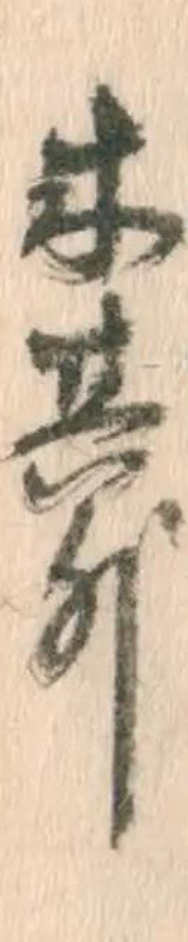木其外

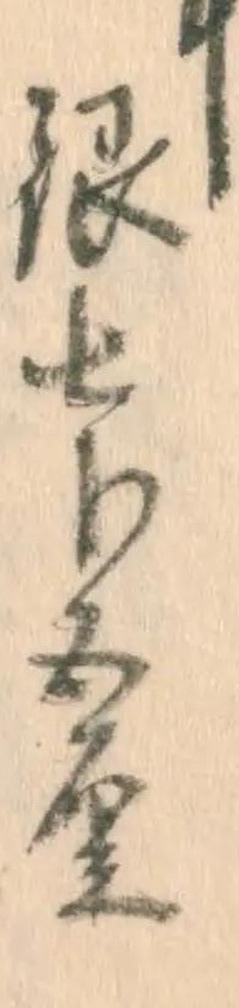銀七分五厘
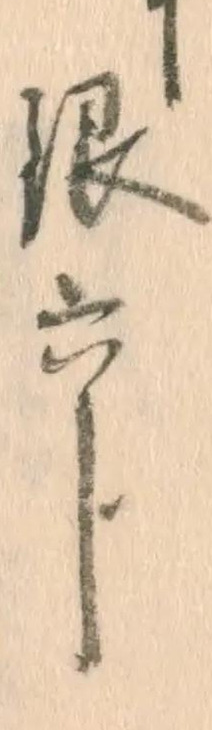銀六分
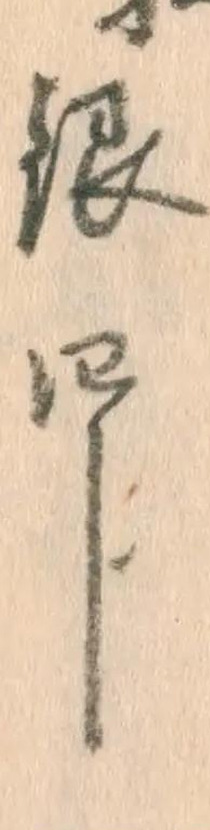銀四分
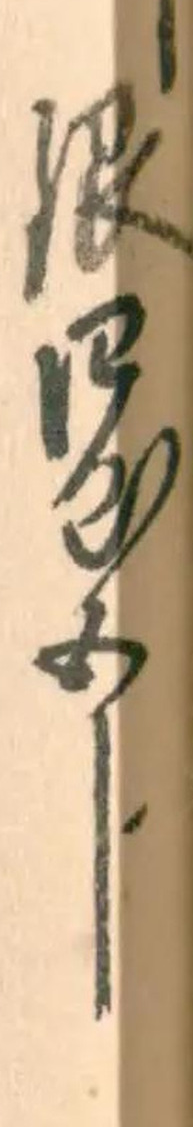銀四匁五分
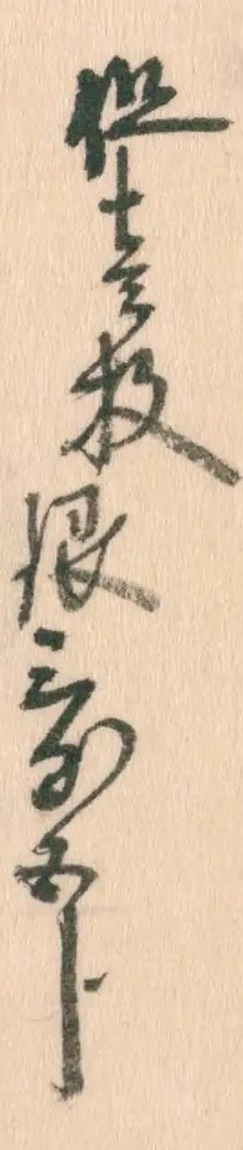銀四匁五分
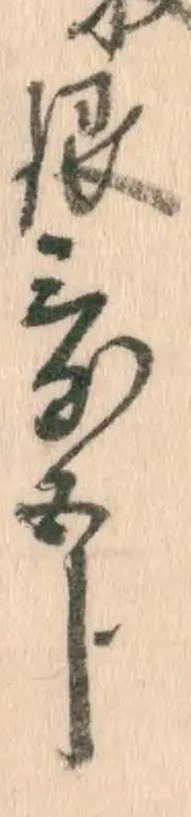銀三匁五分
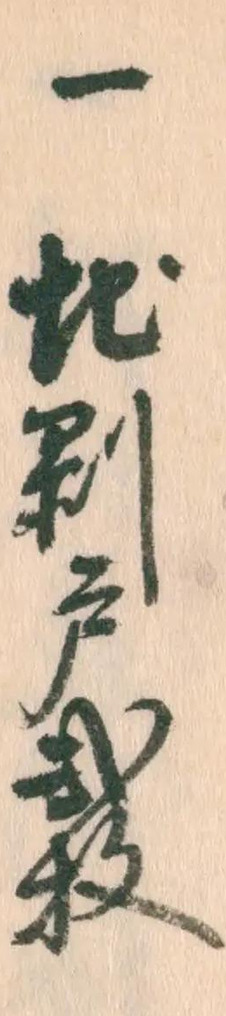一地剥戸弐枚
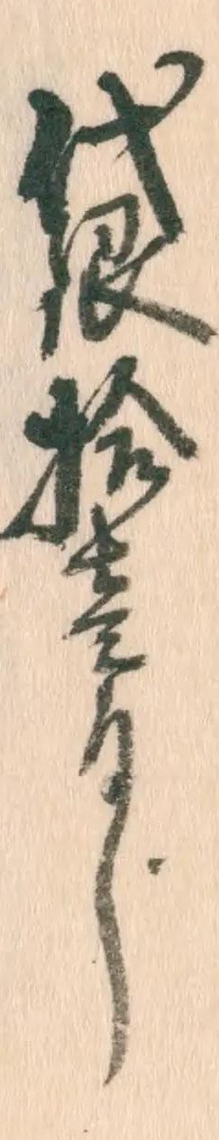代銀拾壱匁但壱枚
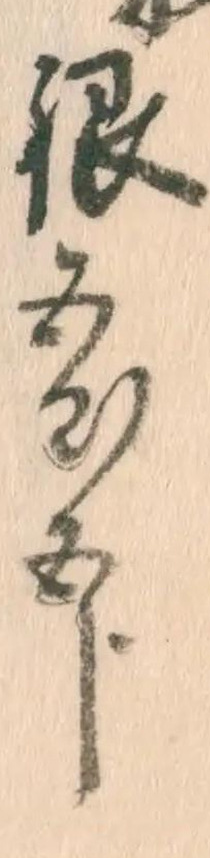銀五匁五分
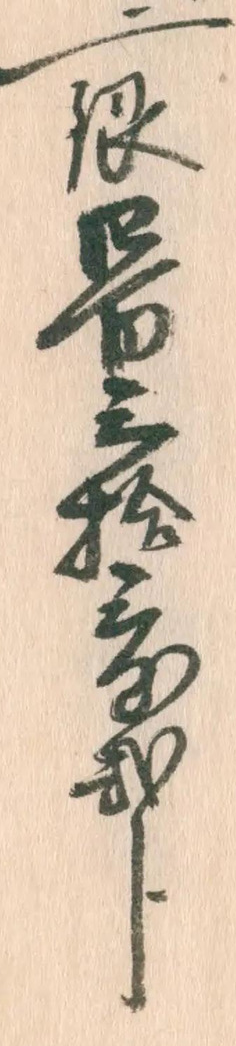〆銀四百三拾三匁弐分

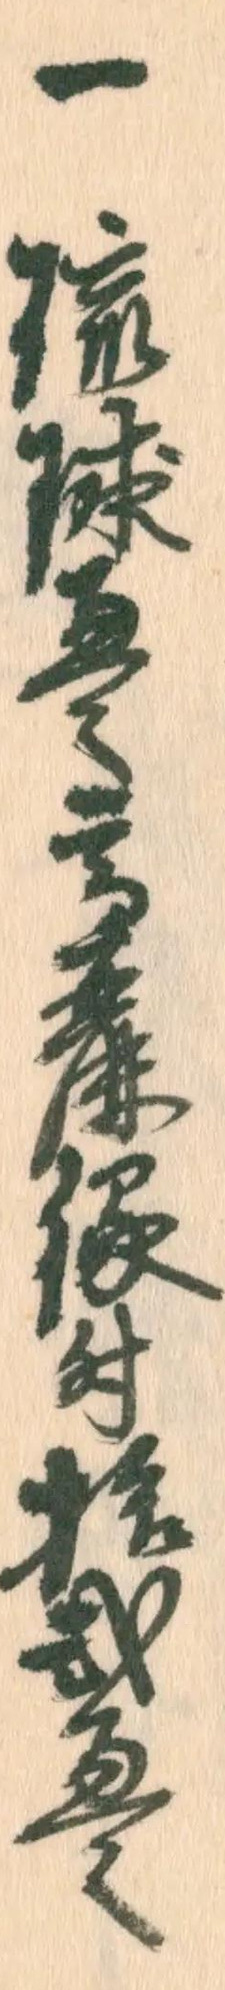一琉球畳高麗縁付拾弐畳
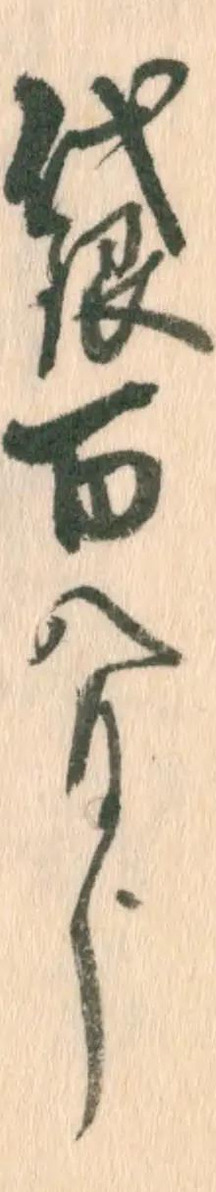代銀参拾匁
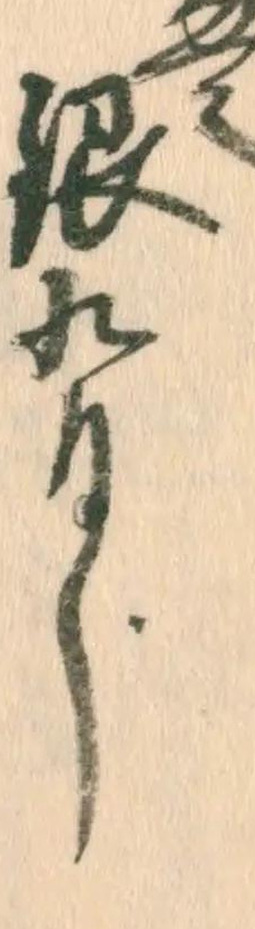銀九匁
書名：三十三間堂. [1]
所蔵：国立国会図書館 National Diet Library, JAPAN
